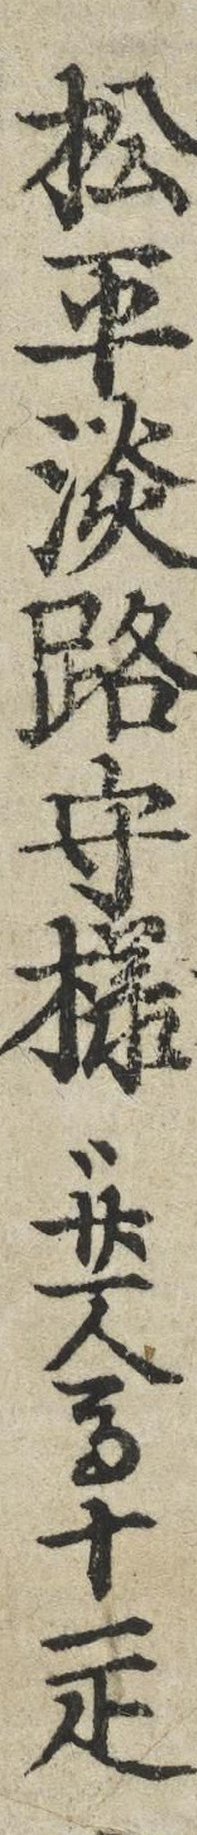松平淡路守様〻廿一人馬十一疋
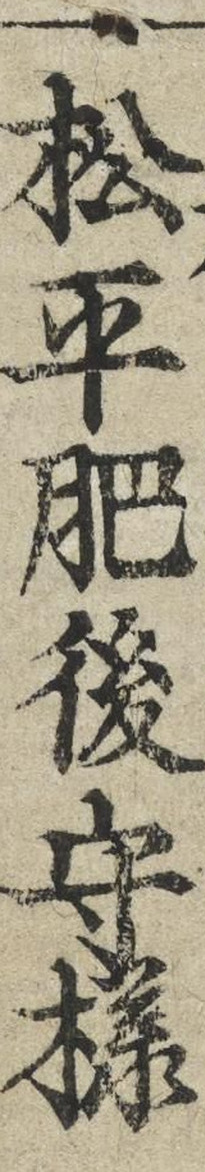松平丹後守様〻
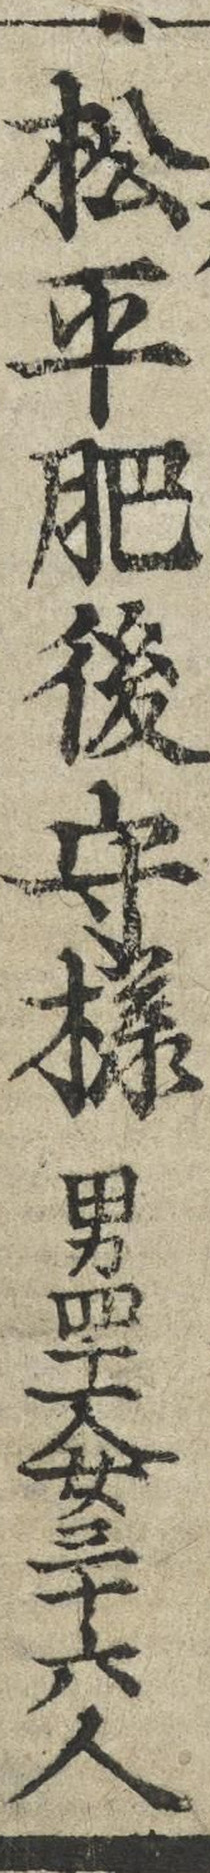松平肥後守様男四十一人女三十六人
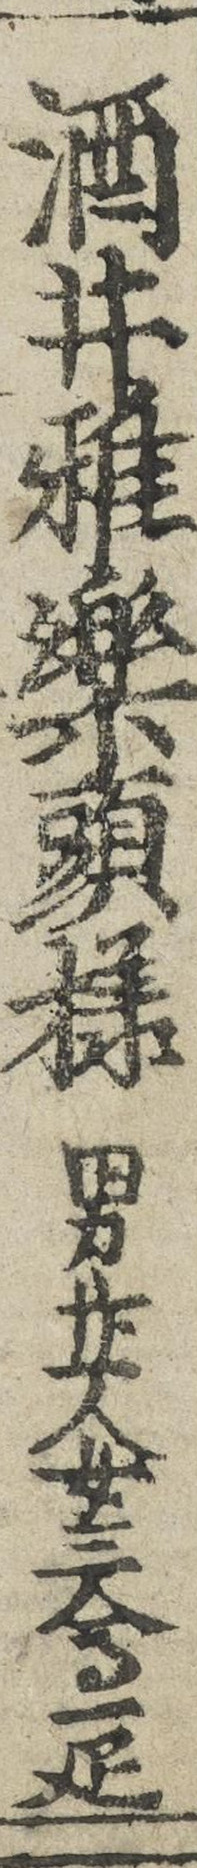酒井雅楽頭様男廿一人女三人馬一疋
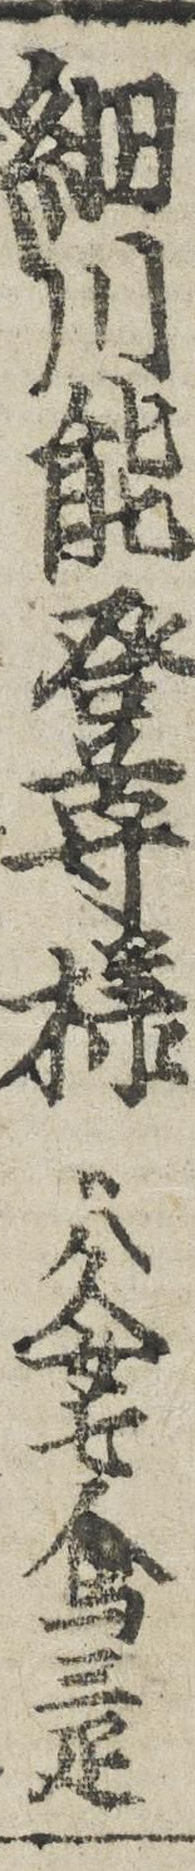細川能登守様〻八人女七人馬三疋
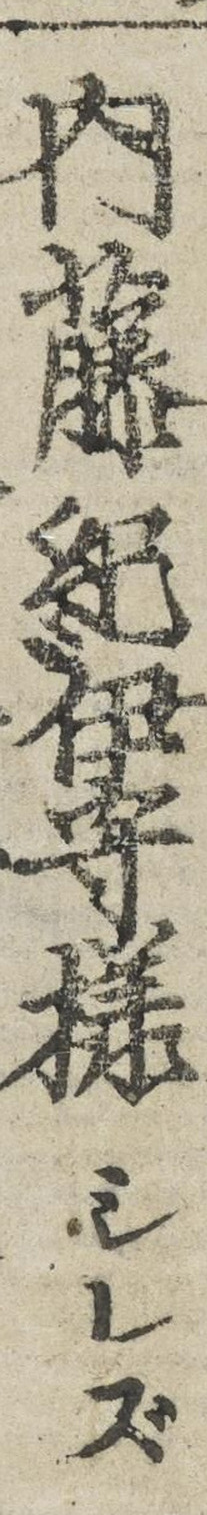内藤紀伊守様シレズ
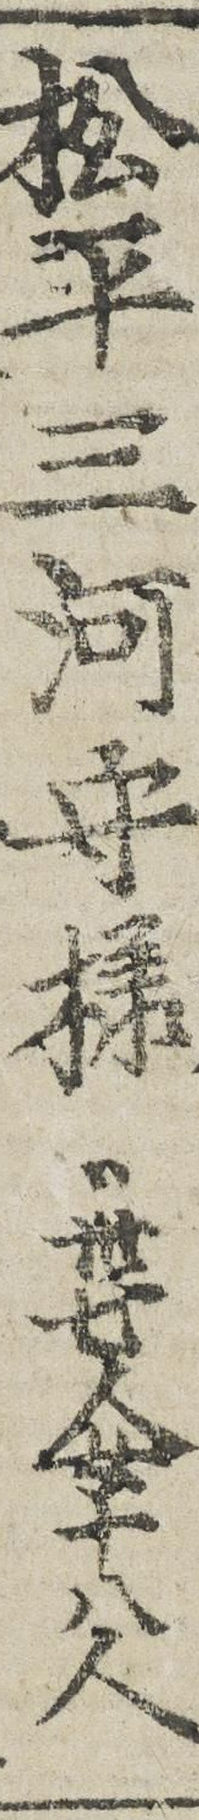松平三河守様〻丗七人女十八人
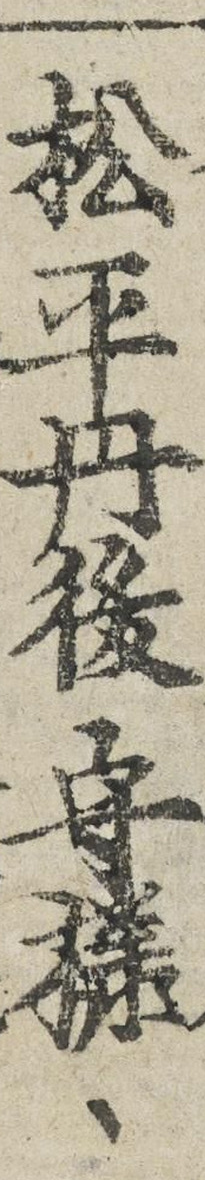松平丹後守様〻
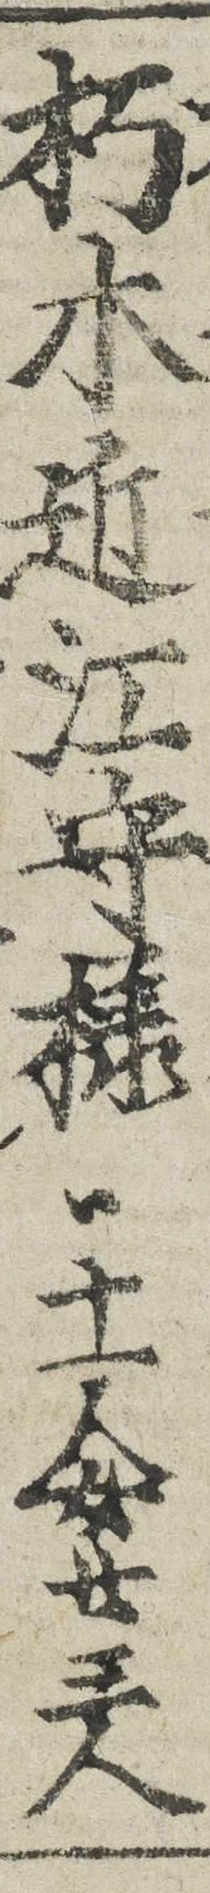朽木近江守様〻十一人女廿三人
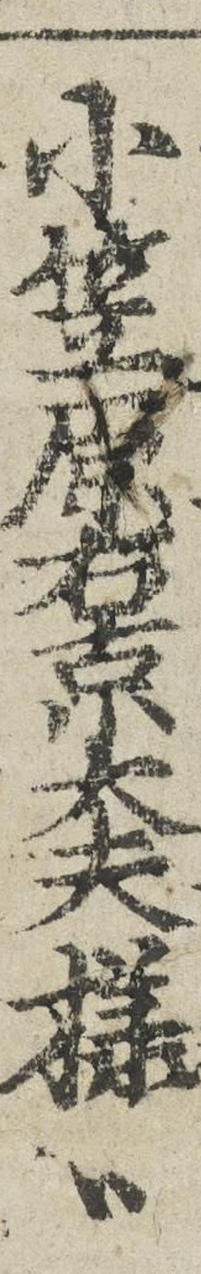小笠原右京大夫様〻
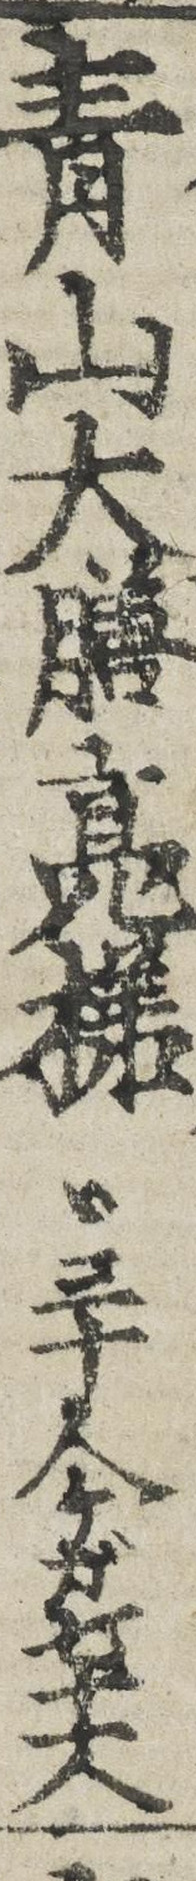青山大膳亮様〻三十人ケガ七十一人
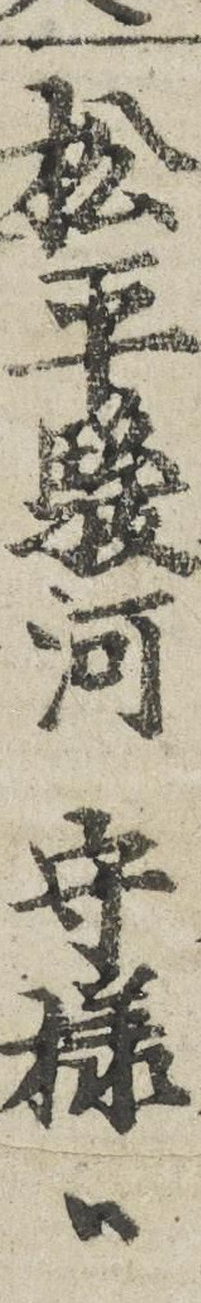松平駿河守様〻
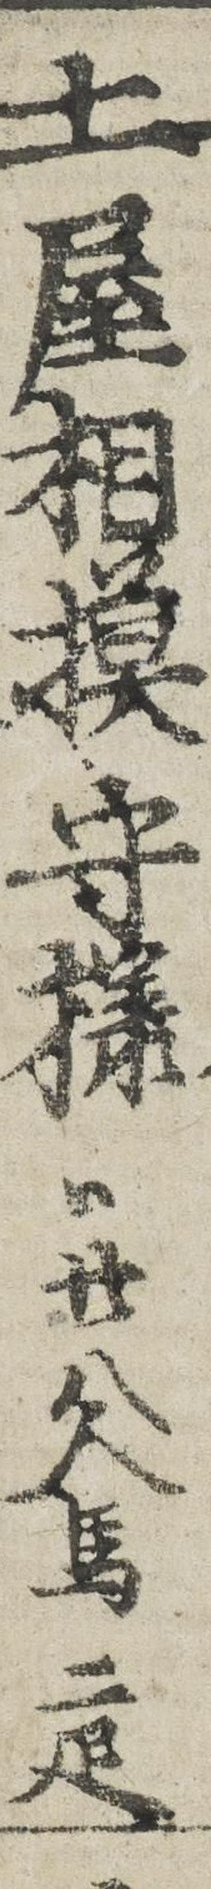土屋相模守様〻廿八人馬二疋
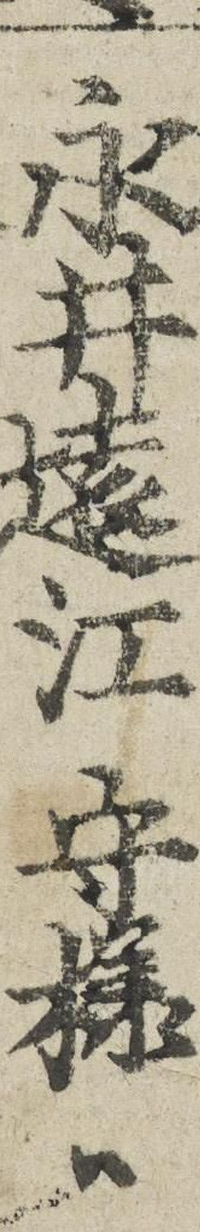永井遠江守様〻
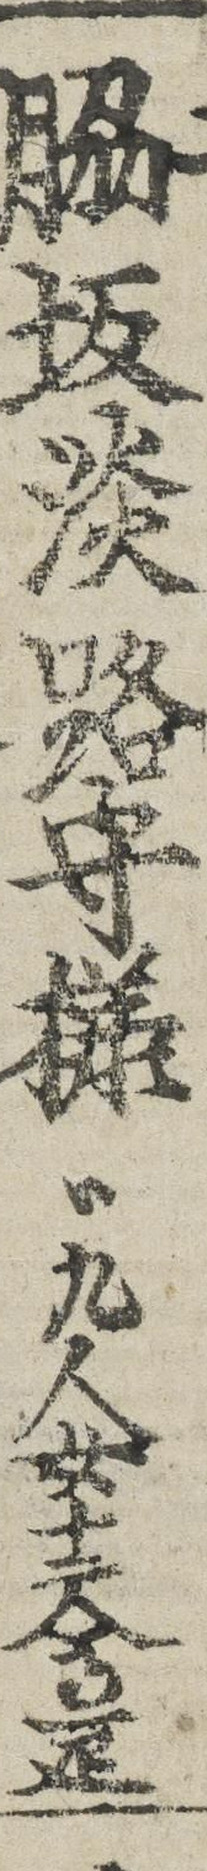脇坂淡路守様〻九人女十二人馬一疋
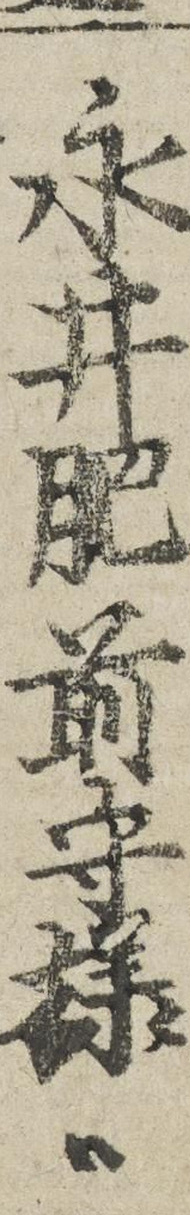永井肥前守様〻
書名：[明暦大火に関する冊子]
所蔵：東京大学地震研究所図書室 Earthquake Research Institute Library, The University of Tokyo, JAPAN
